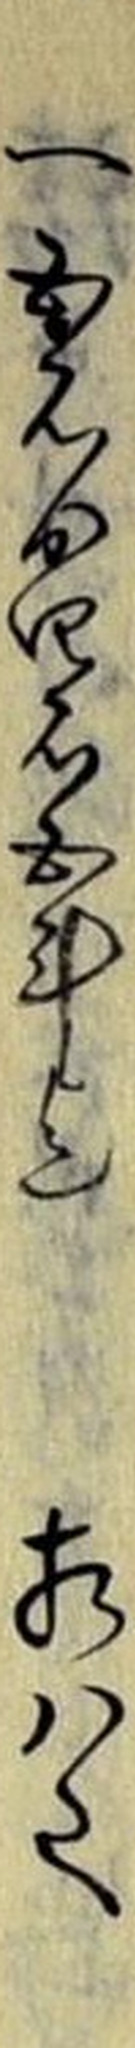一五石ゟ四石五斗迄拾八匁
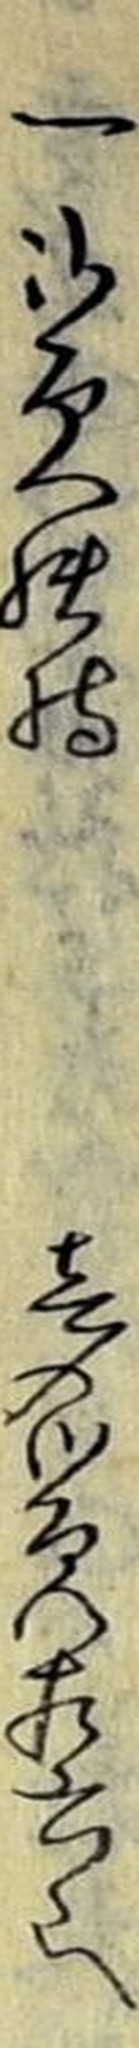一弐百人扶持壱〆弐百八拾六匁
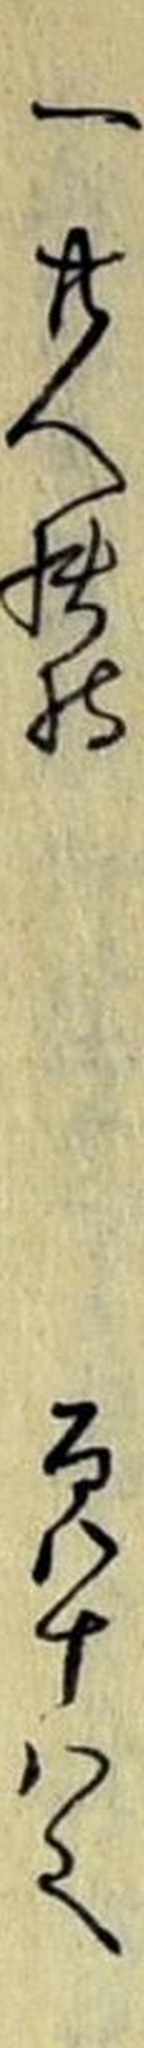一廿人扶持百八十八匁
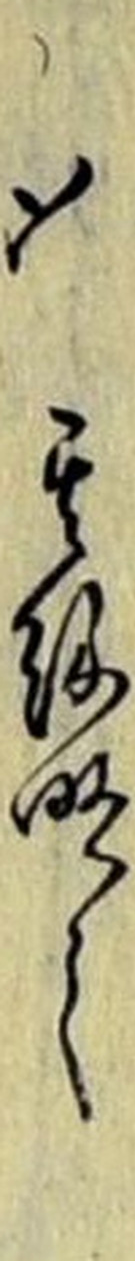〆其余略之
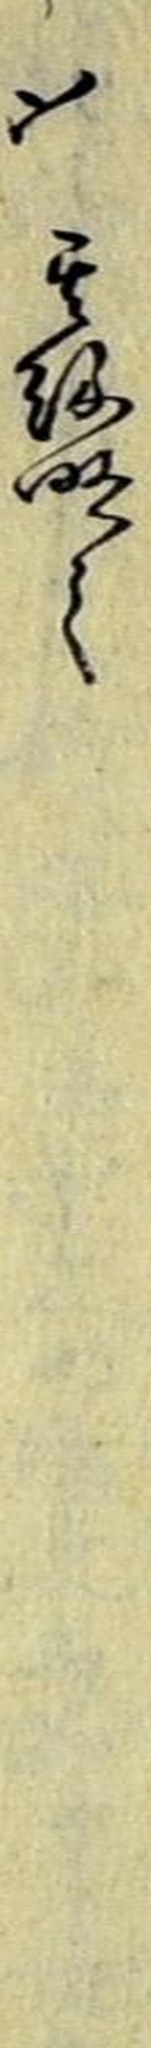〆其余略之
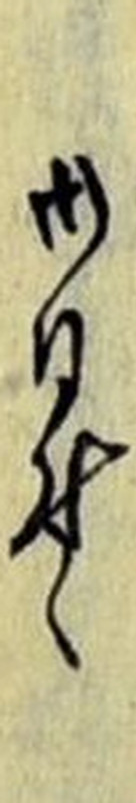御目付へ
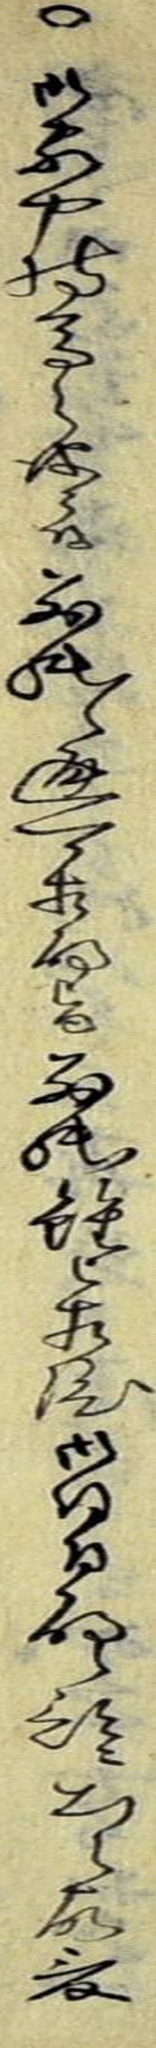○御家中持馬之儀に付別紙之通可相触旨別紙雖被相渡御目付触之部に出之故爰
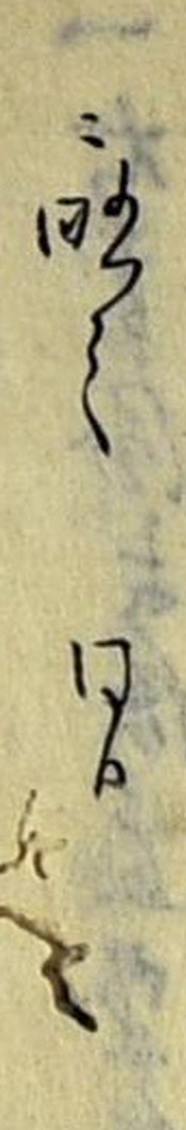に略之同日

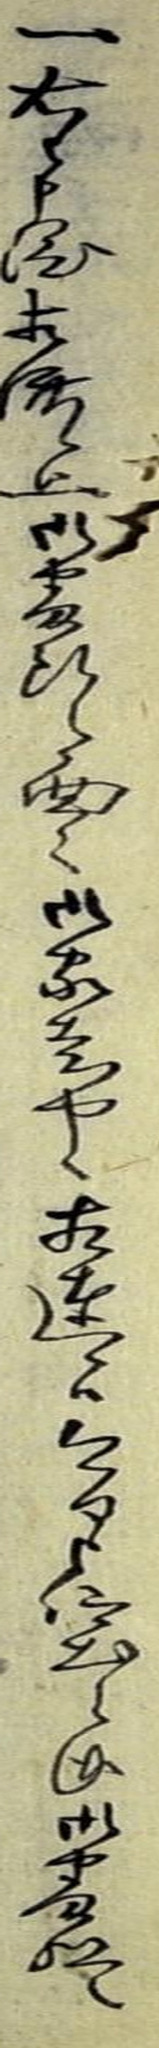一右被申渡相済候上御番頭之面々御家老中へ相達候ハ今日被仰出候趣御番組之
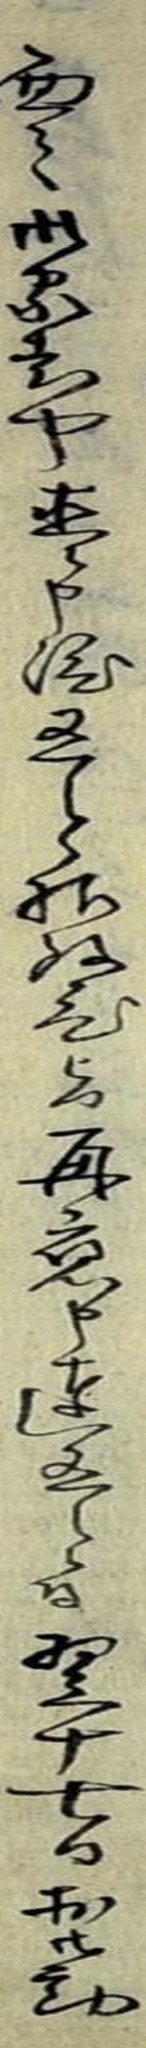面々へ御家老中直々申渡有之候様致度旨再応申達有之候に付翌十七日於御勘
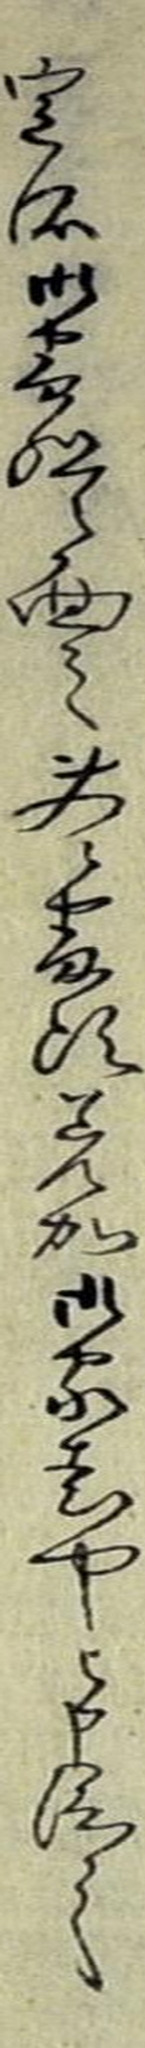定所御番組之面々へ夫々番頭差加御家老中被申渡之
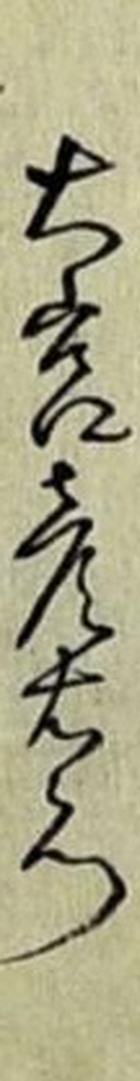大宮彦右衛門
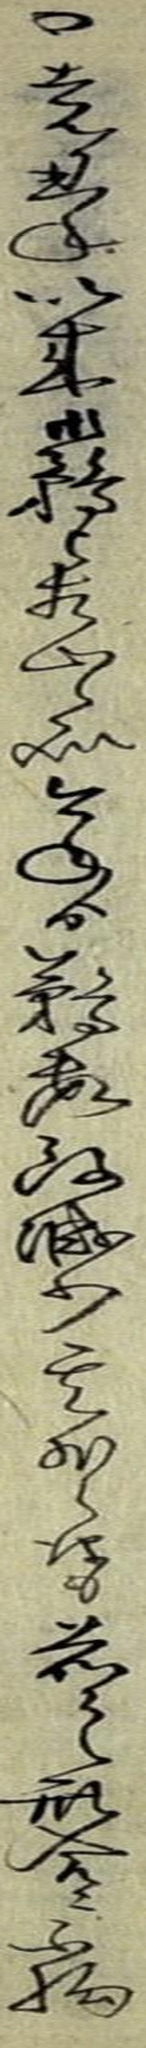○去ル丑年以来御鵜被相止候処今年ゟ鵜数致減少其外之儀も前々之形合に不拘
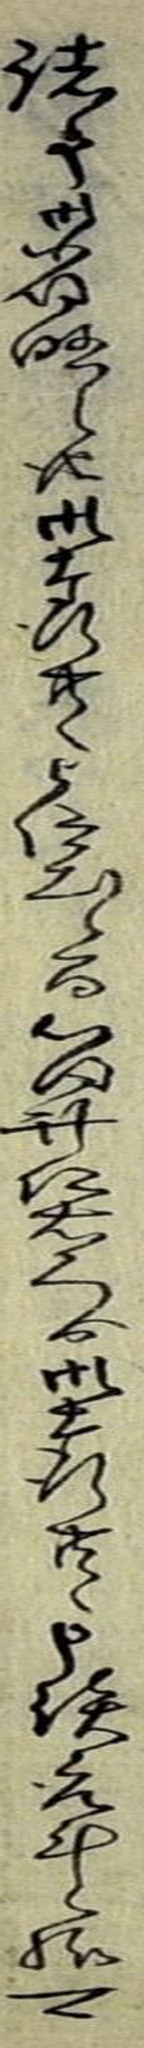諸事御省略之儀御奉行共へ被仰出候間筒井仁右衛門ゟ御奉行共へ申談取斗候様可
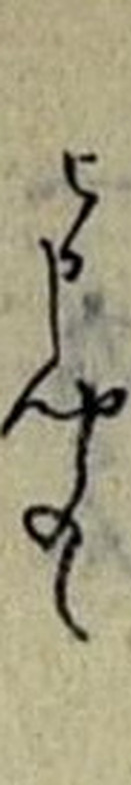被申聞候
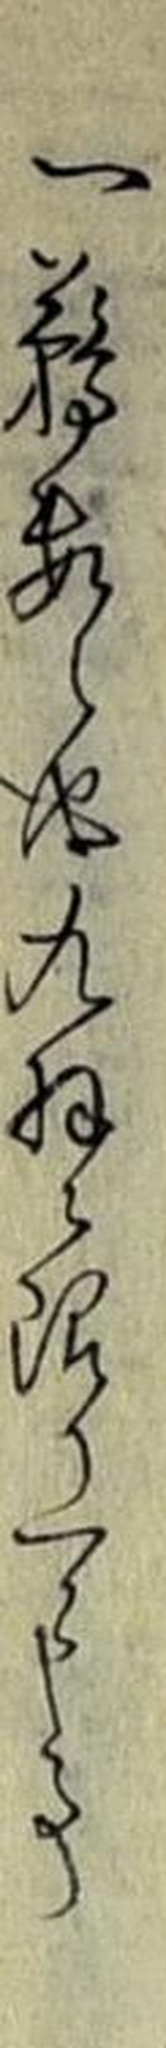一鵜数之儀九羽に限り可申事
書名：命令之部 四
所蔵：福井県文書館 Fukui Prefectural Archives
